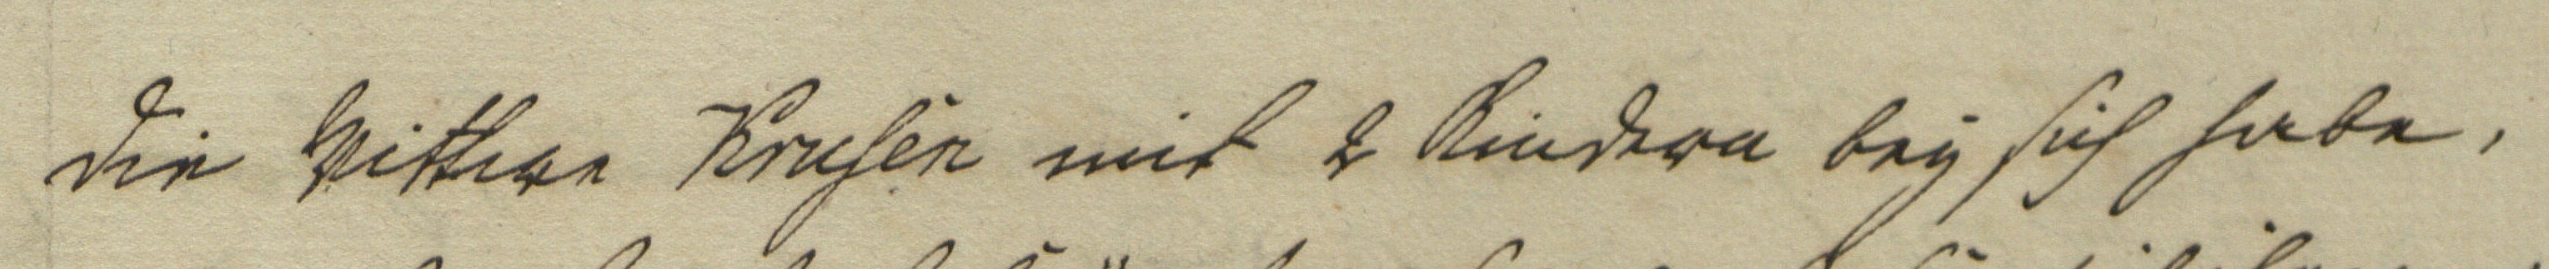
die Wittwe Krusen mit 2 Kindern beÿ sich habe,
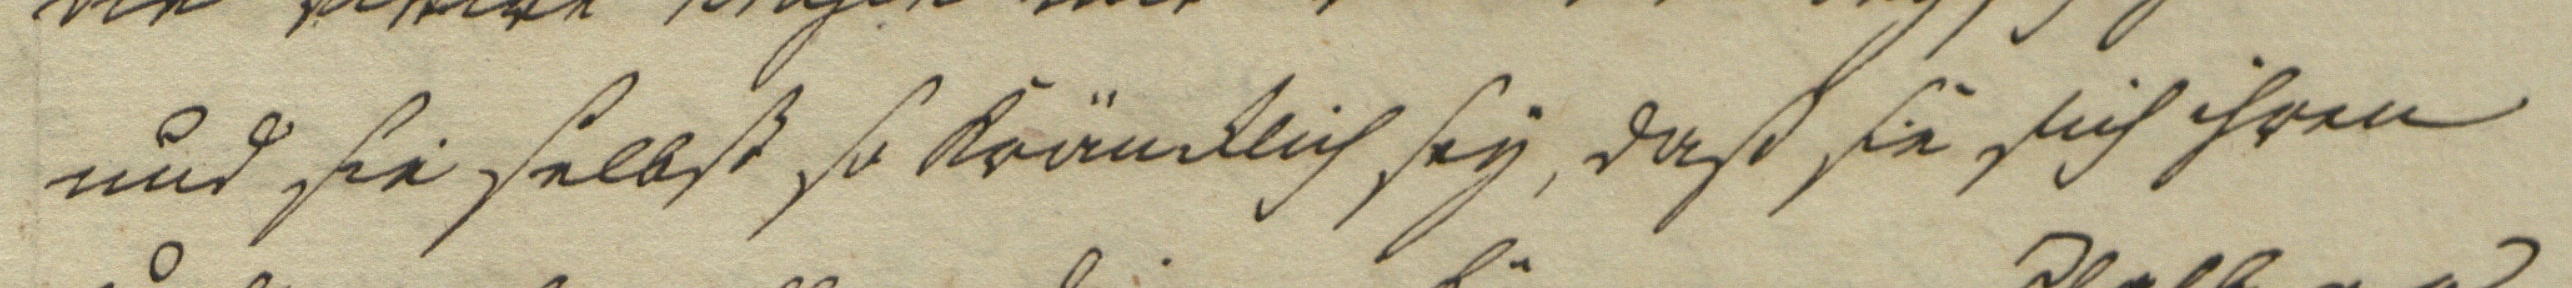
und sie selbst so kräncklich seÿ, daß sie sich ihren
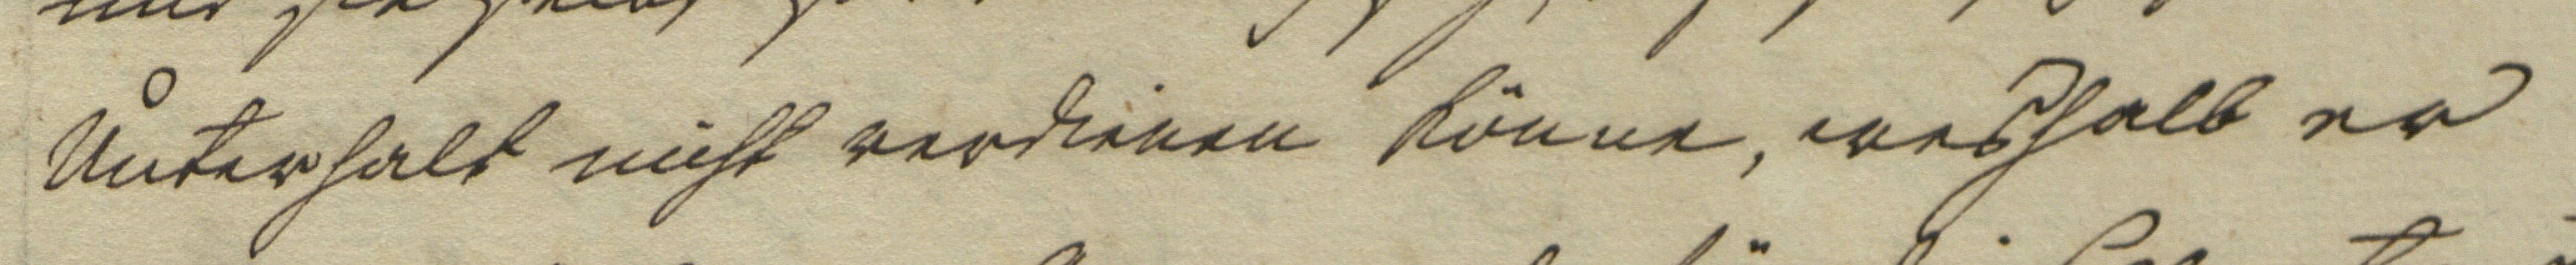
Unterhalt nicht verdienen könne, weshalb er
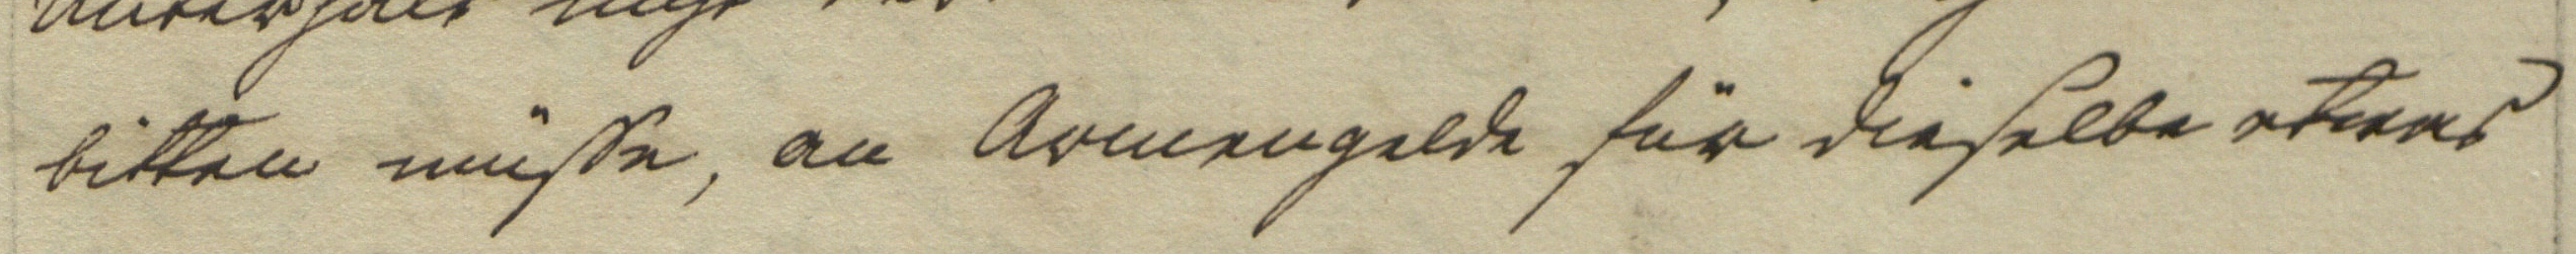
bitten müsse, an Armengelde für dieselbe etwas
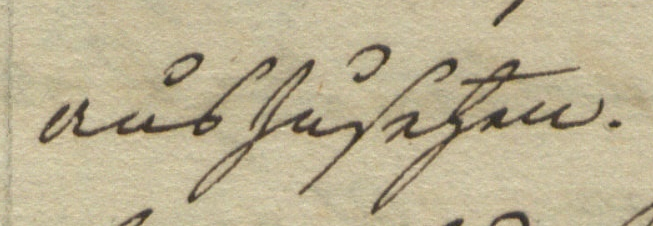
auszusetzen.
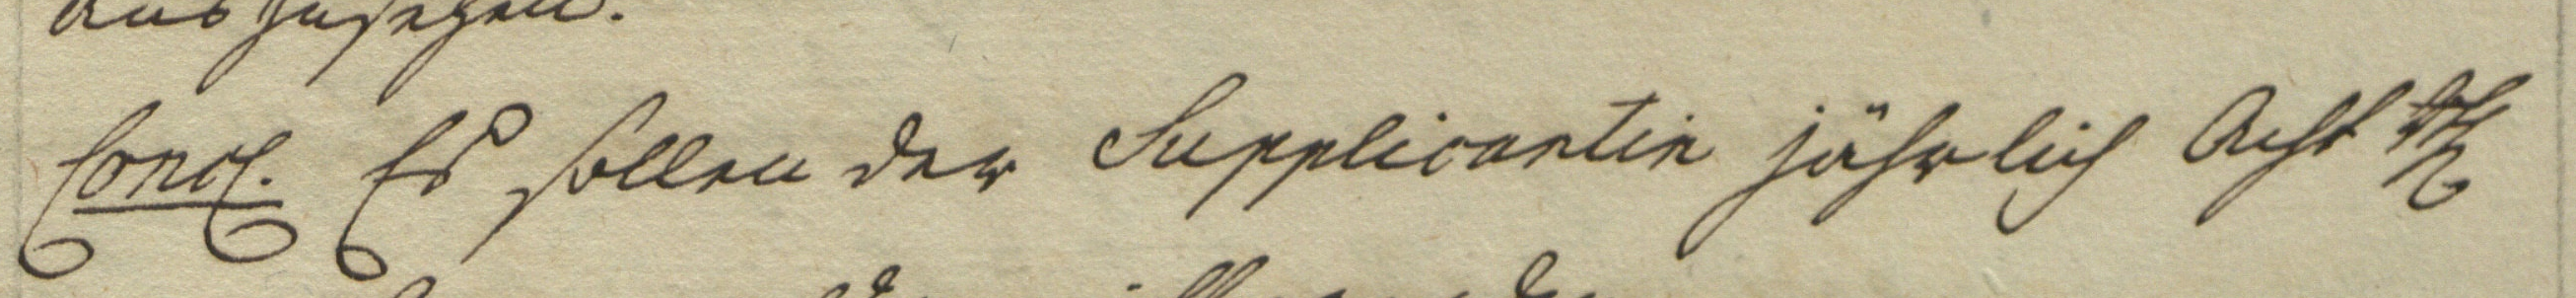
Concl. Es sollen der Supplicantin jährlich Acht Rth
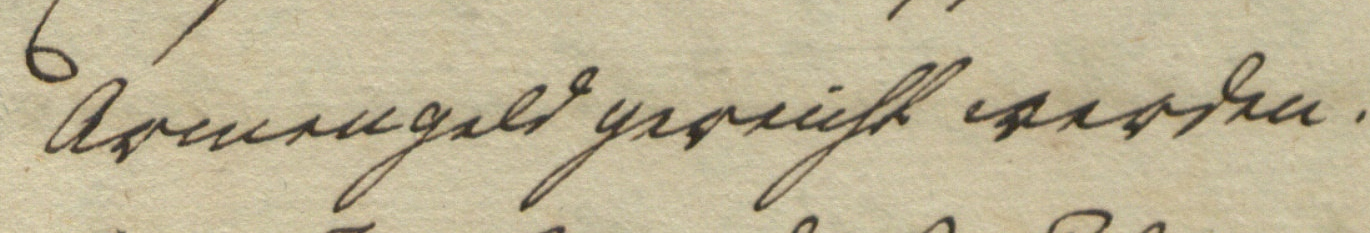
Armengeld gereicht werden.
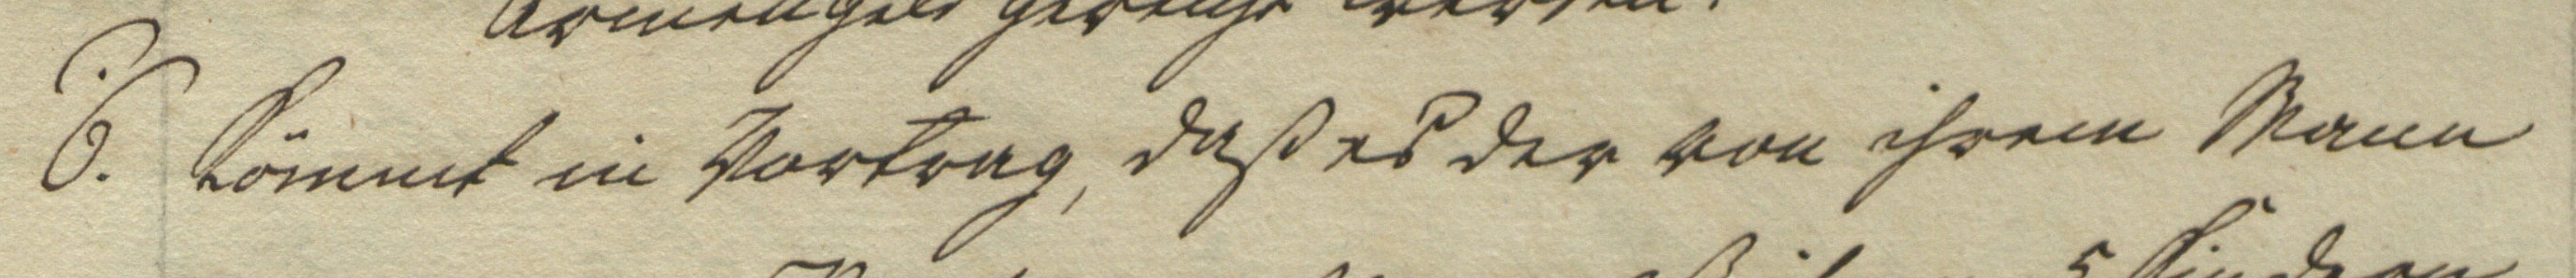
6. Kömmt in Vortrag, daß es der von ihrem Mann
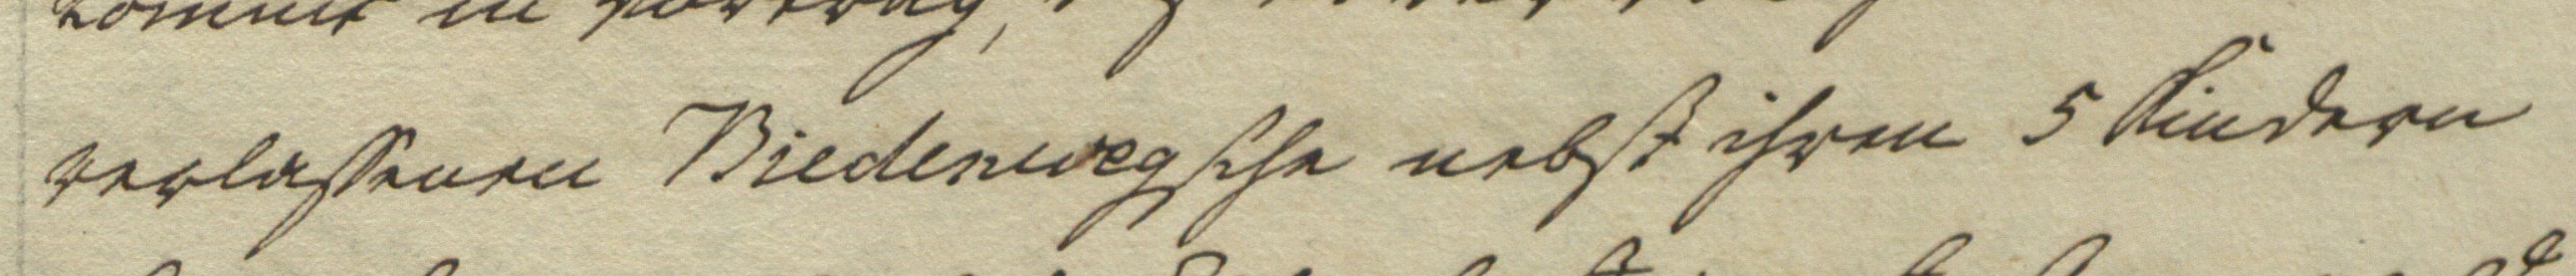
verlassenen Biedenwegsche nebst ihren 5 Kindern
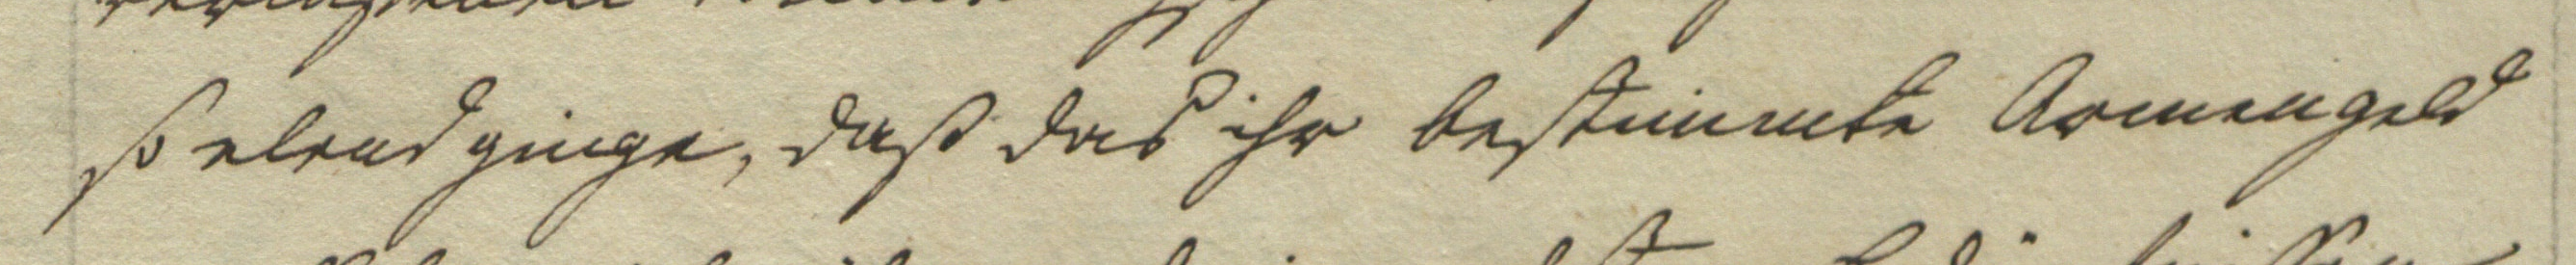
so elend ginge, daß das ihr bestimmte Armengeld
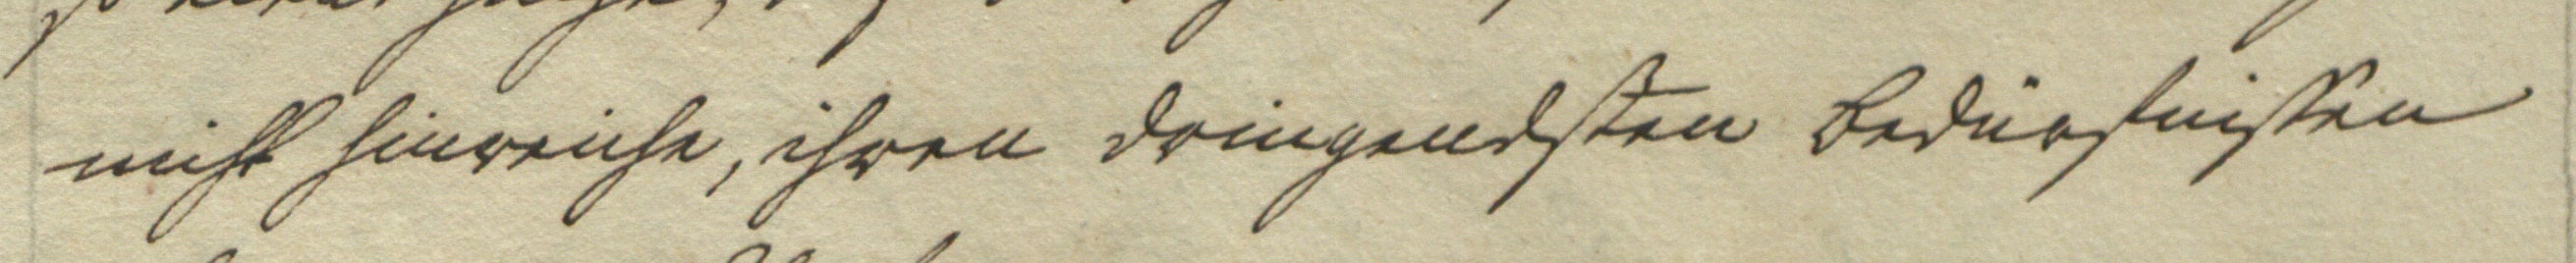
nicht hinreiche, ihren dringendsten Bedürfnissen
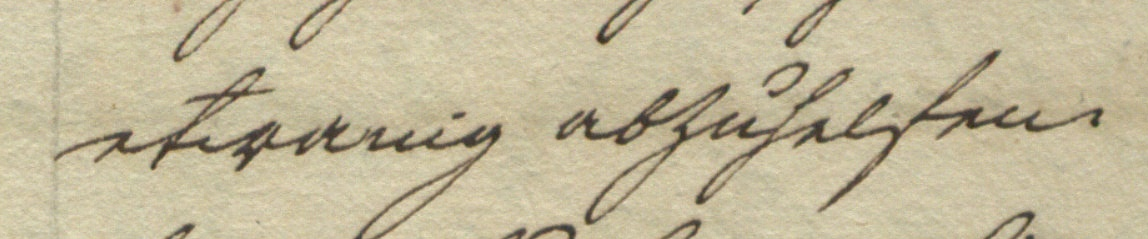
etwanig abzuhelfen.
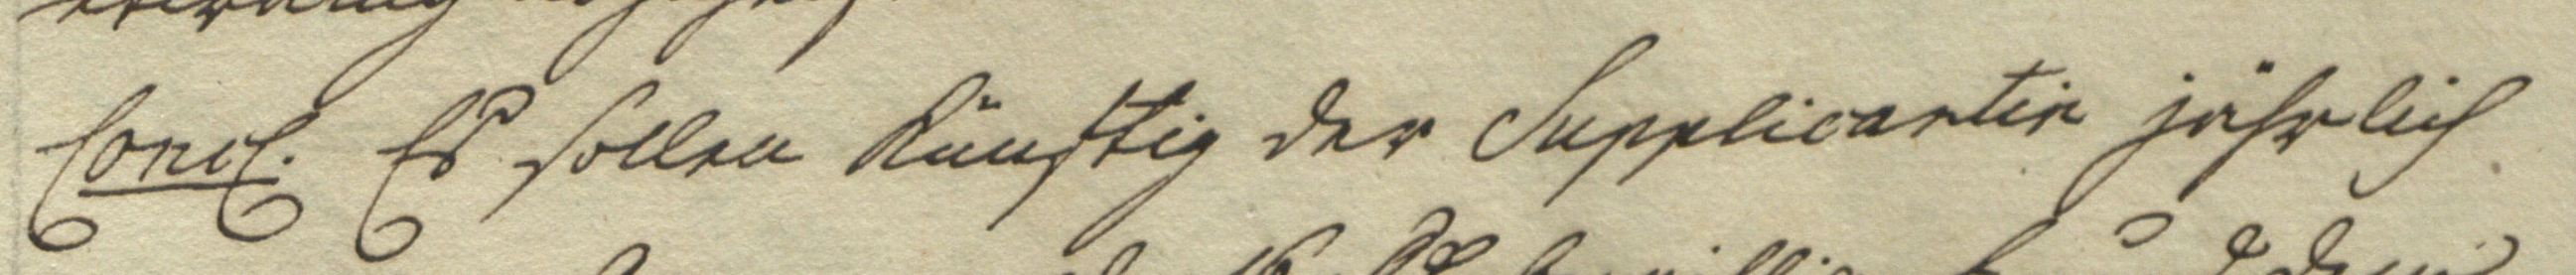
Concl. Es sollen künftig der Supplicanten jährlich
